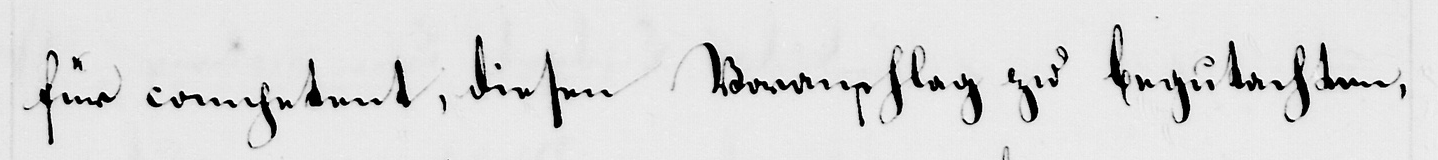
für competent, diesen Voranschlag zu begutachten,
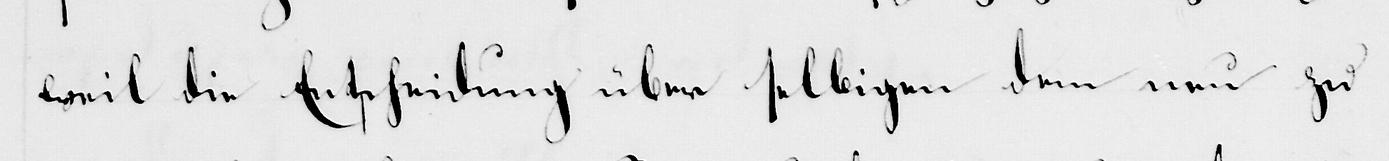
weil die Entscheidung über selbigen dem neu zu
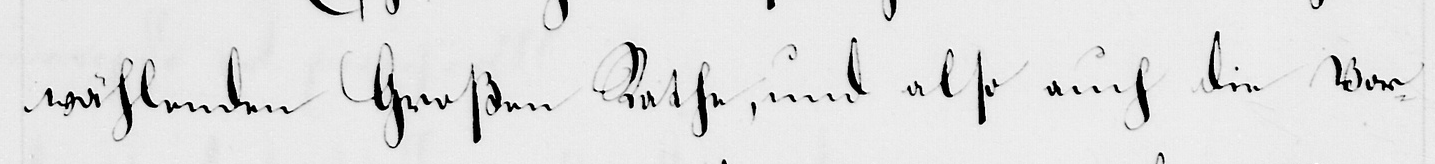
wählenden Großen Rathe, und also auch die Vor¬
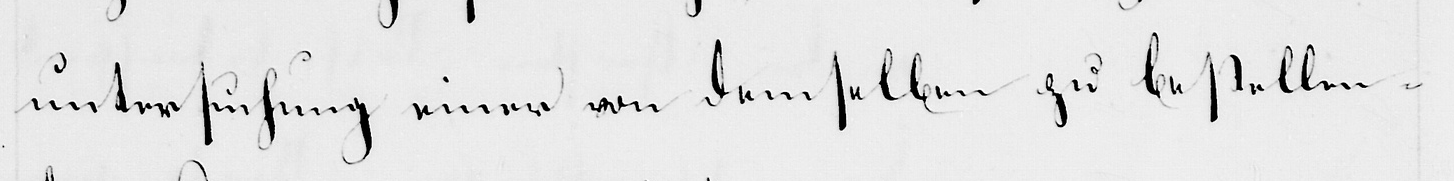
untersuchung einer von demselben zu bestellen¬
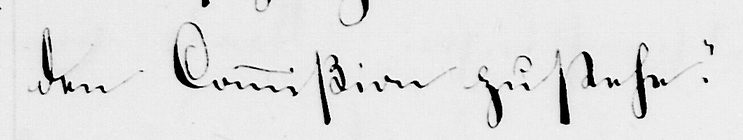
den Commißion zustehe.“
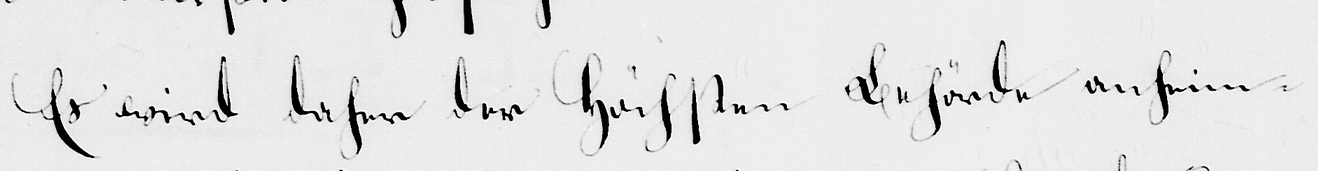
Es wird daher der Höchsten Behörde anheim¬
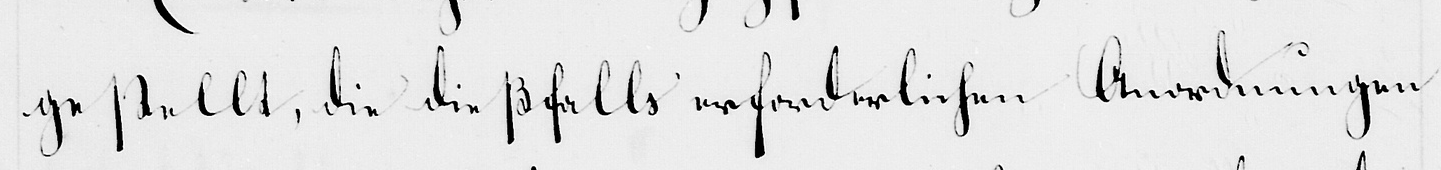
gestellt, die dießfalls erforderlichen Anordnungen
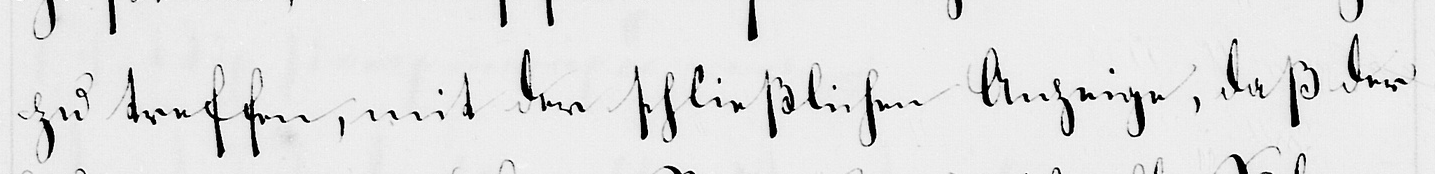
zu treffen, mit der schließlichen Anzeige, daß der
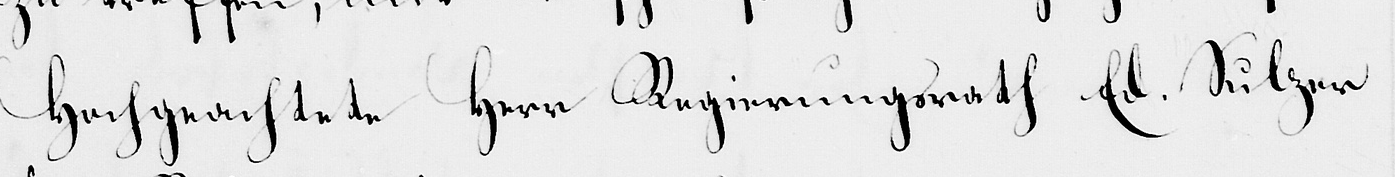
Hochgeachtete Herr Regierungsrath Ed. Sulzer
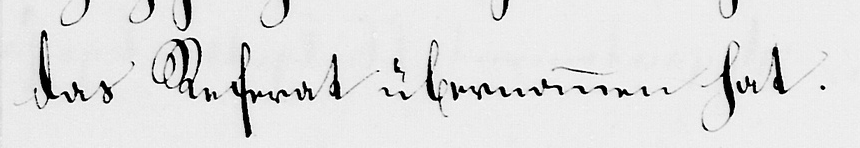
das Referat übernommen hat.
